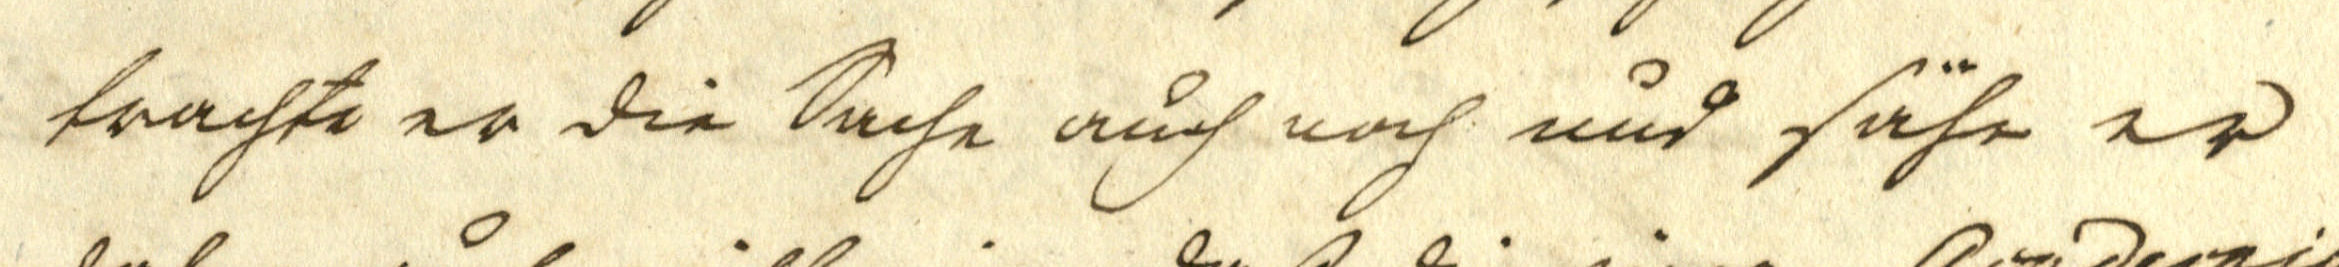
trachte er die Sache auch noch und sähe er
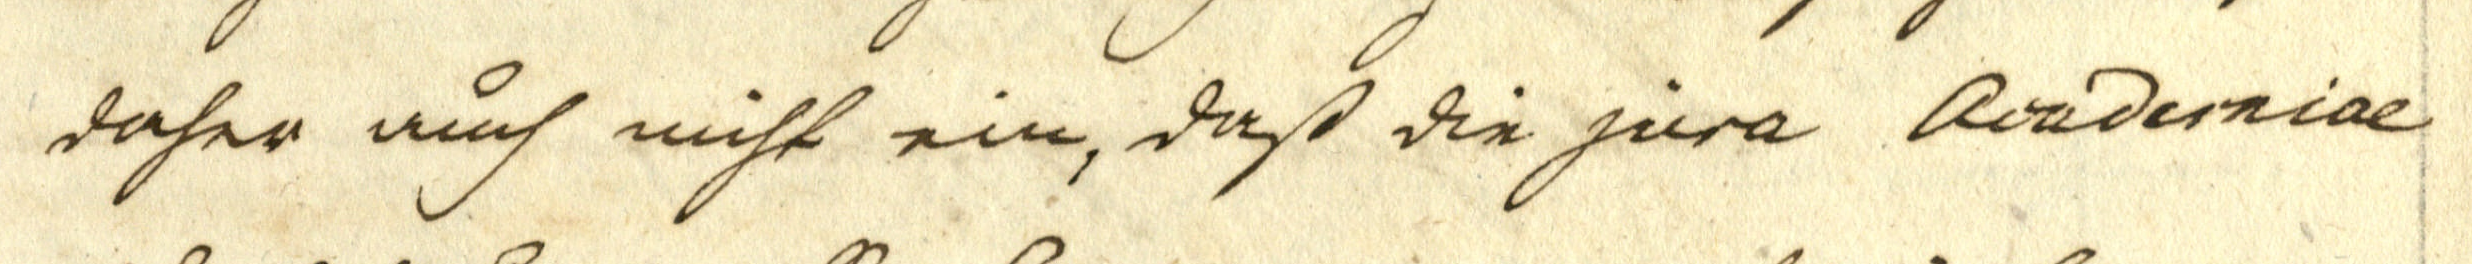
daher auch nicht ein, daß die jura Academiae
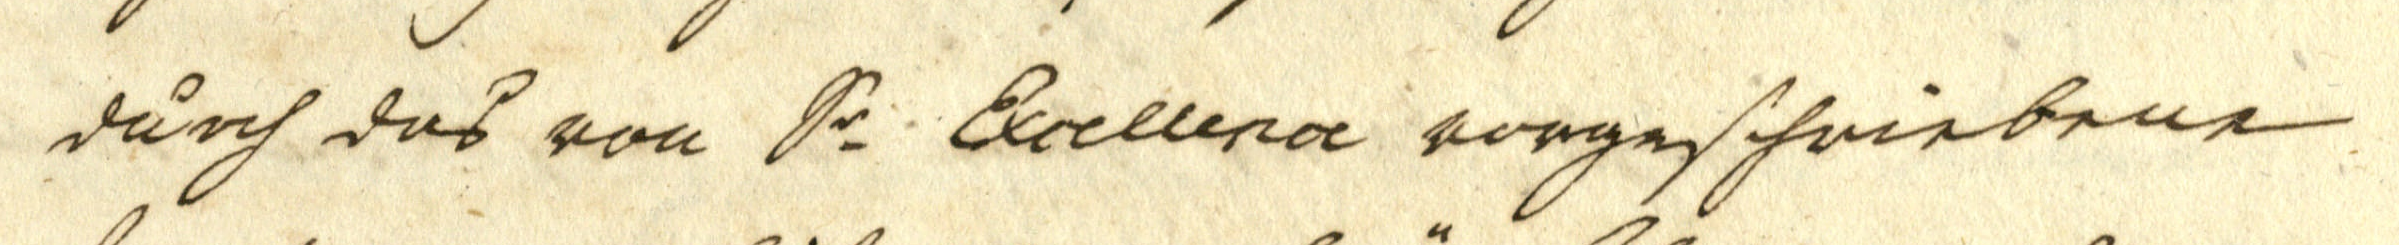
durch das von Sr. Excellence vorgeschriebene
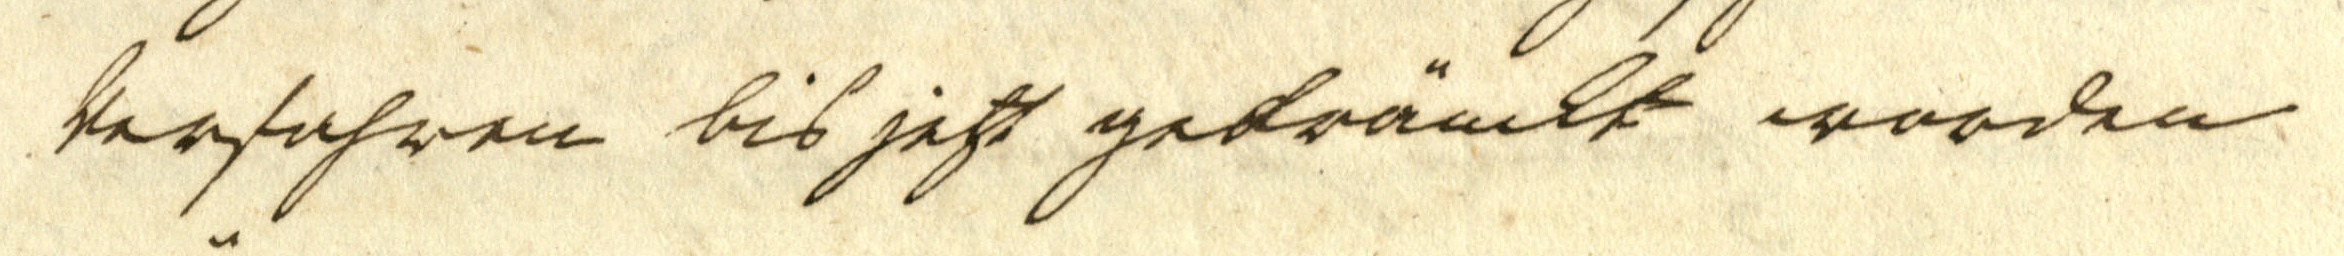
Verfahren bis jetzt gekränckt worden
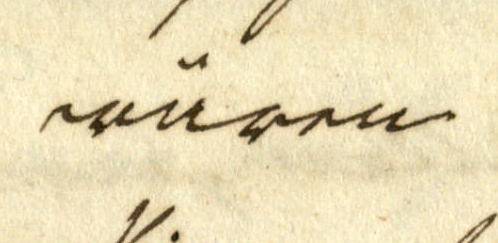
wären.
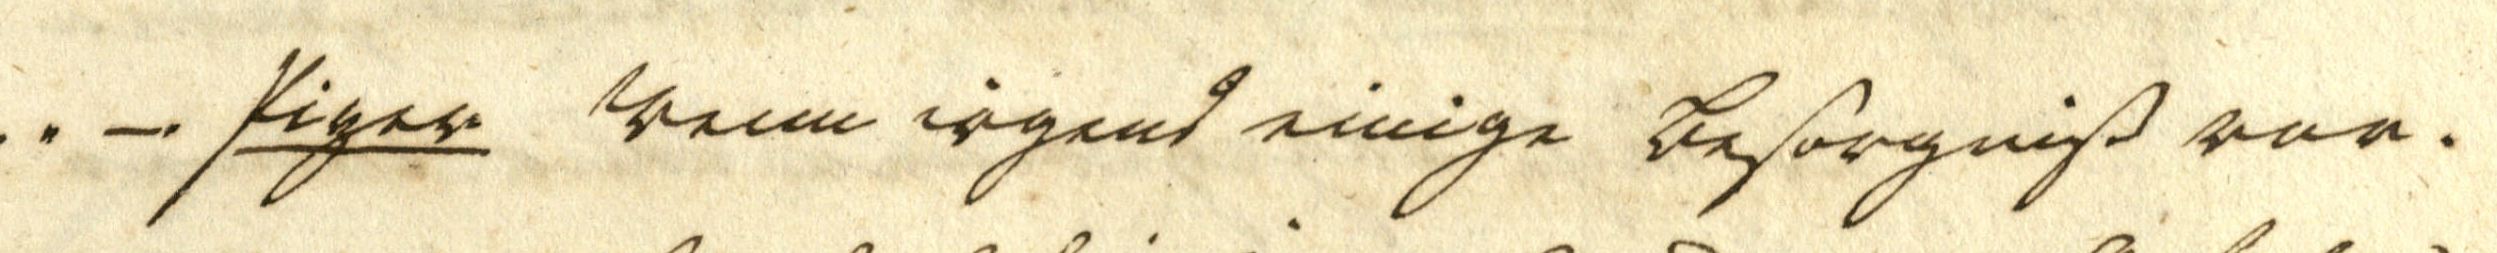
Piper. Wenn irgend einige Besorgniß vor¬
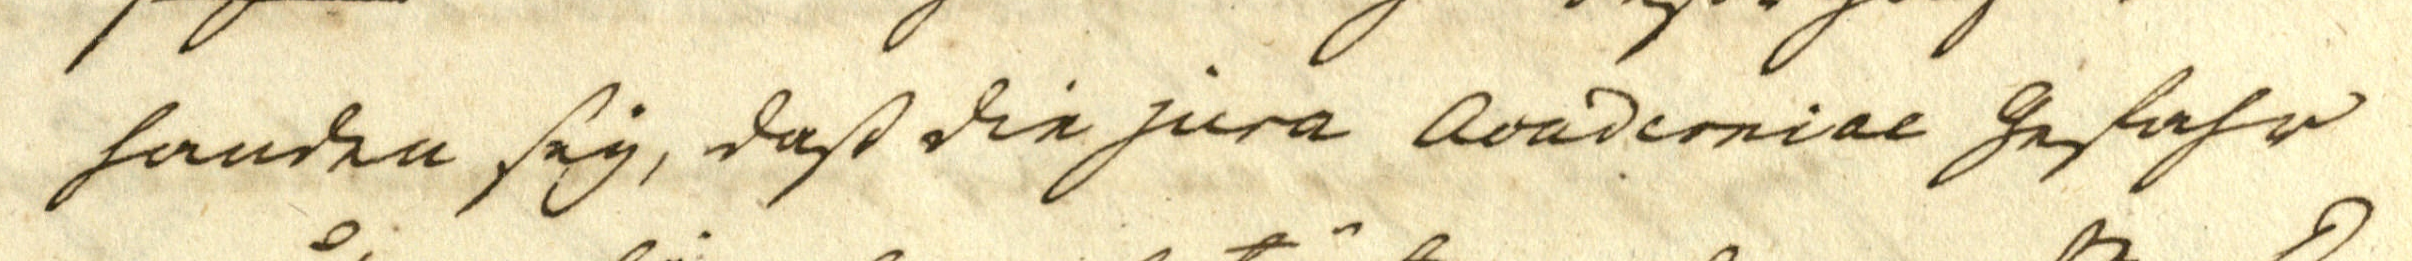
handen seÿ, daß die jura Academiae Gefahr
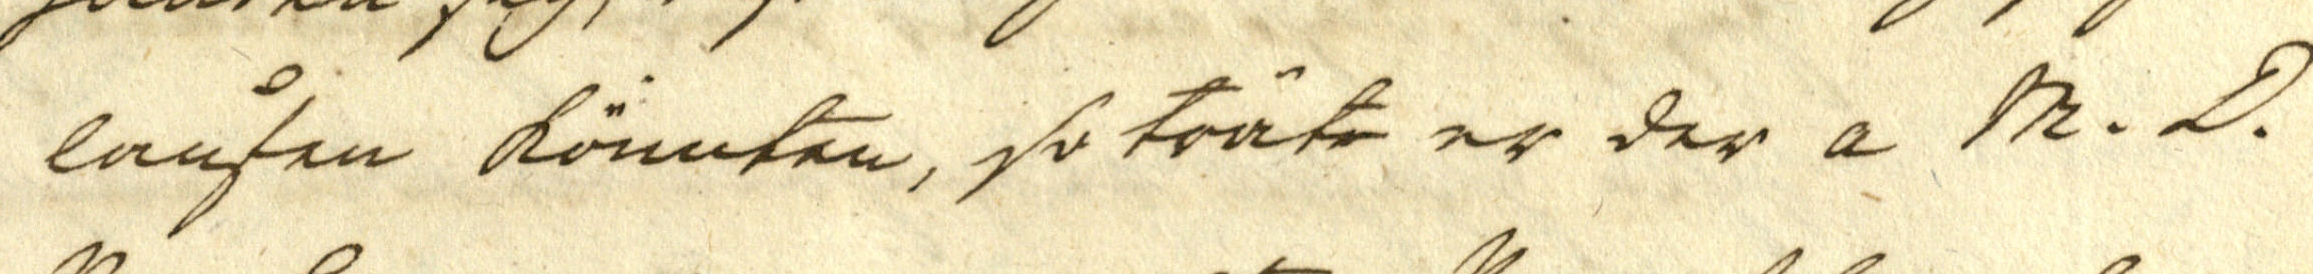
laufen könnten, so träte er der a M. D.
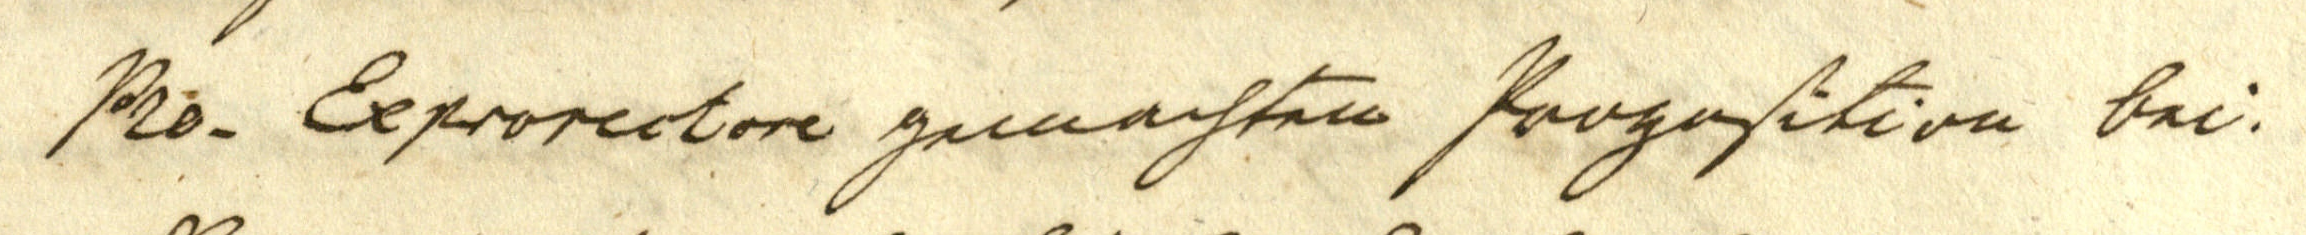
Pro. Exprorectore gemachten Proposition bei.
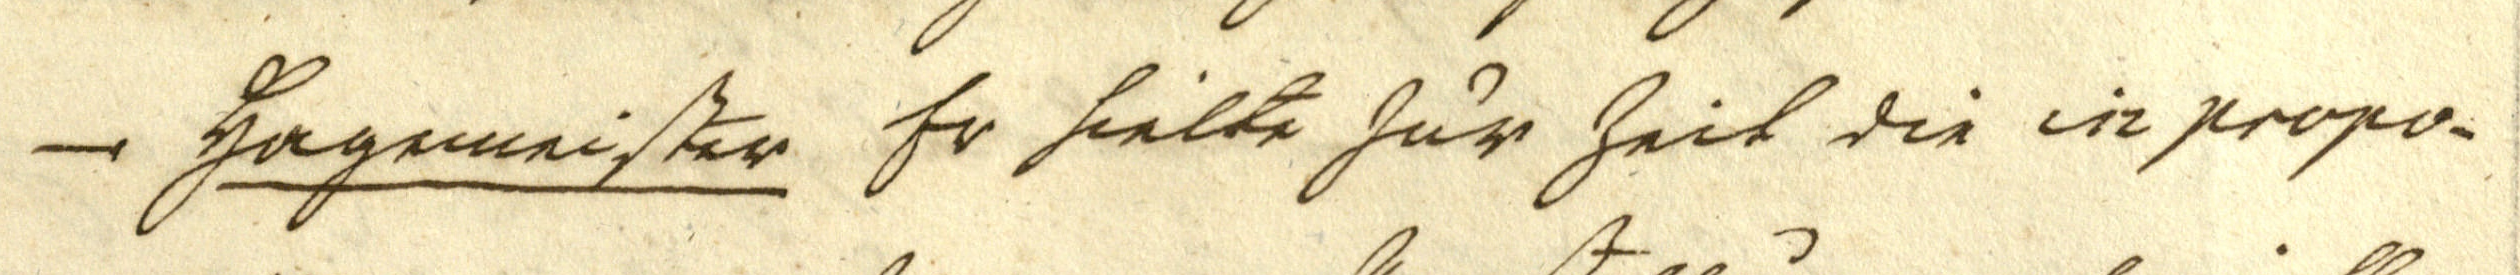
Hagemeister Er hielte zur Zeit die in propo¬
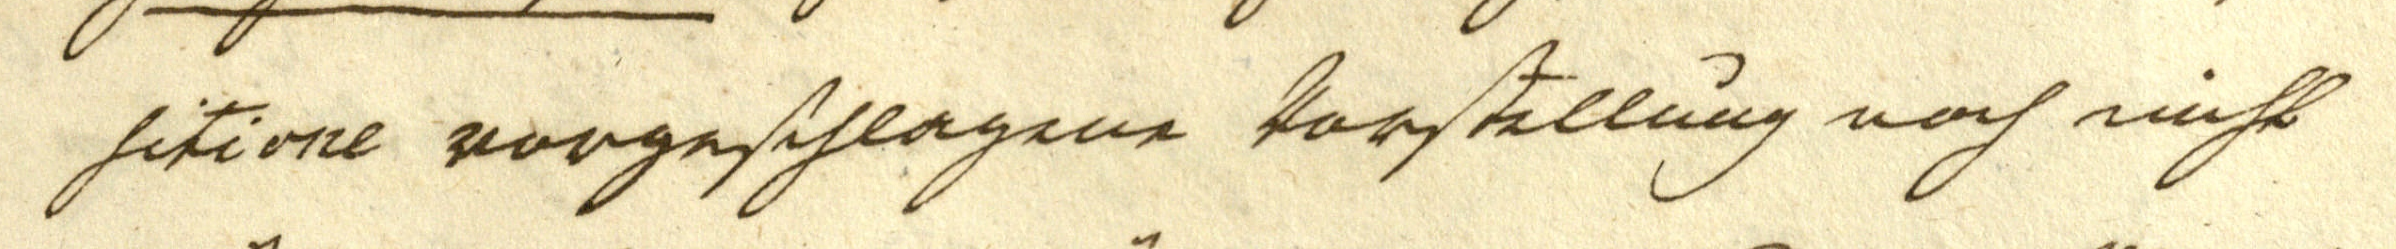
sitione vorgeschlagene Vorstellung noch nicht
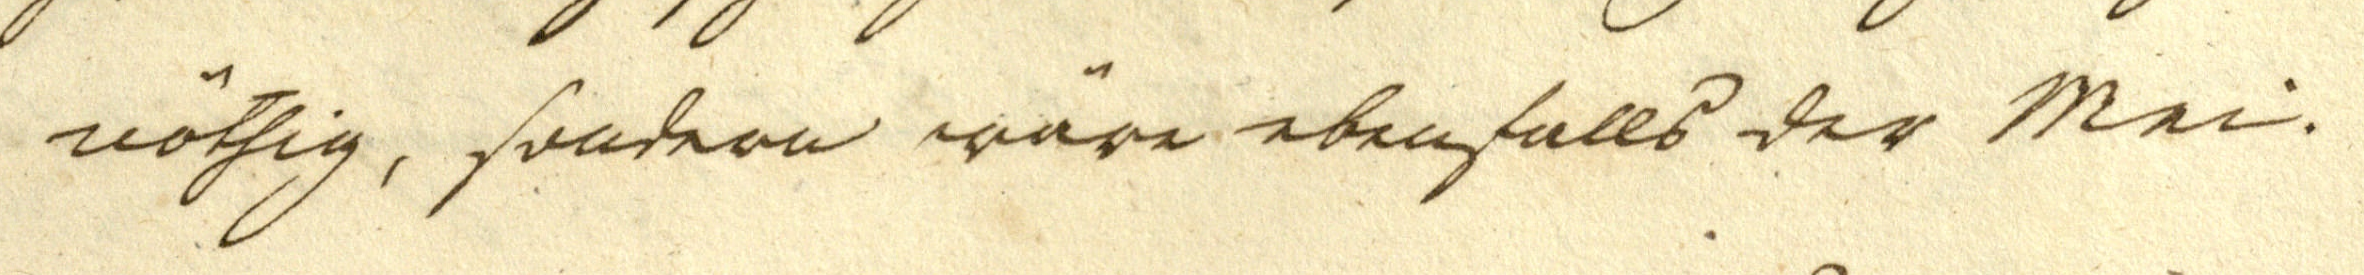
nöthig, sondern wäre ebenfalls der Mei¬
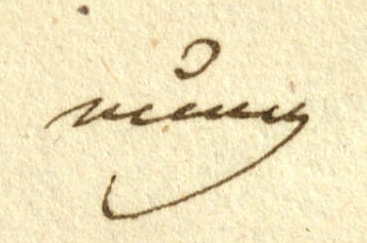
nung
